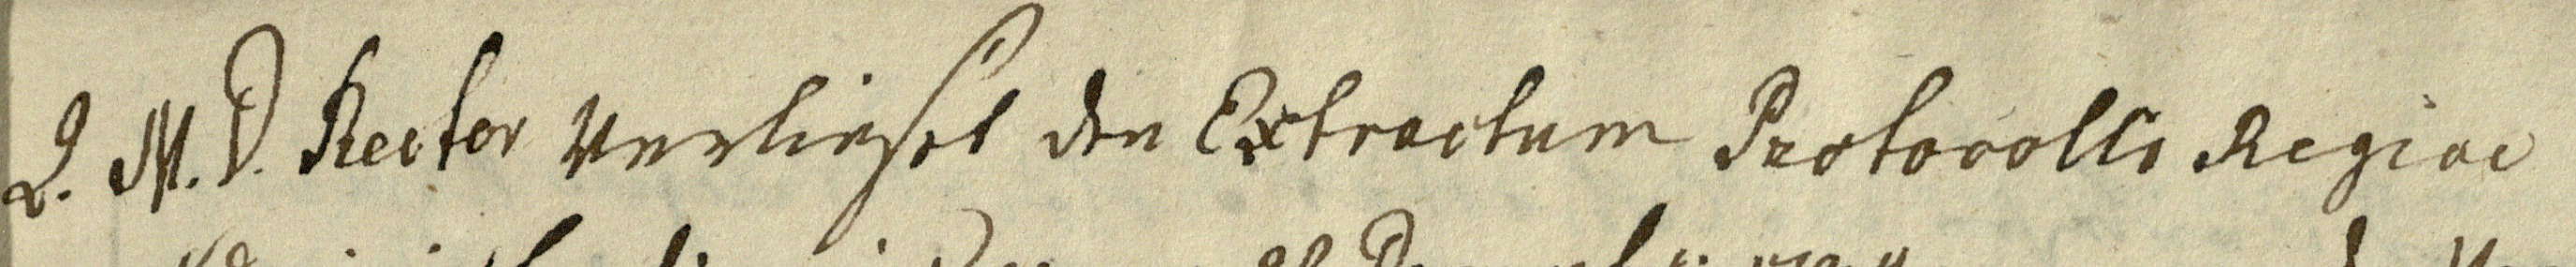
2. M. D. Rector verlieset den Extractum Protocolli Regiae
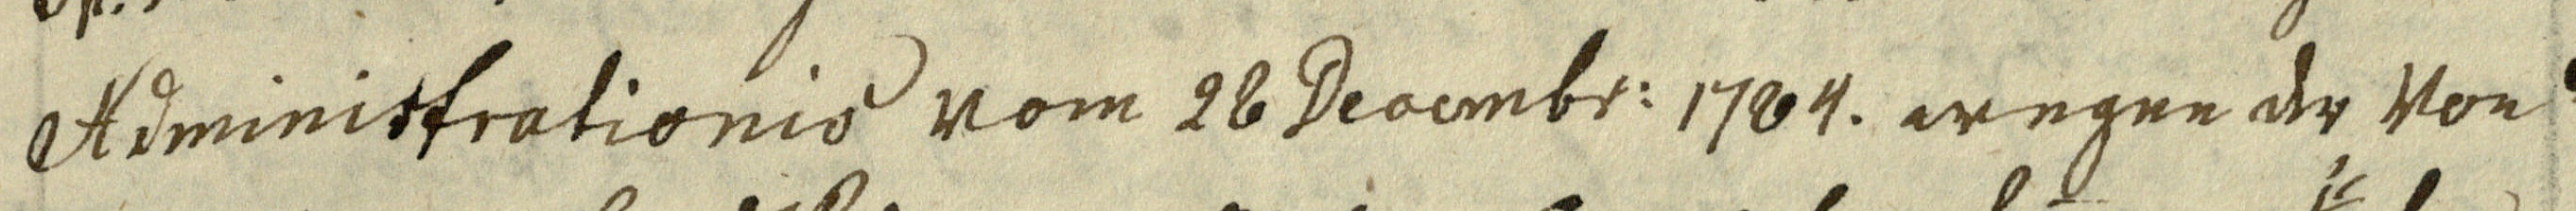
Administrationis vom 28 Decembr: 1784. wegen der von
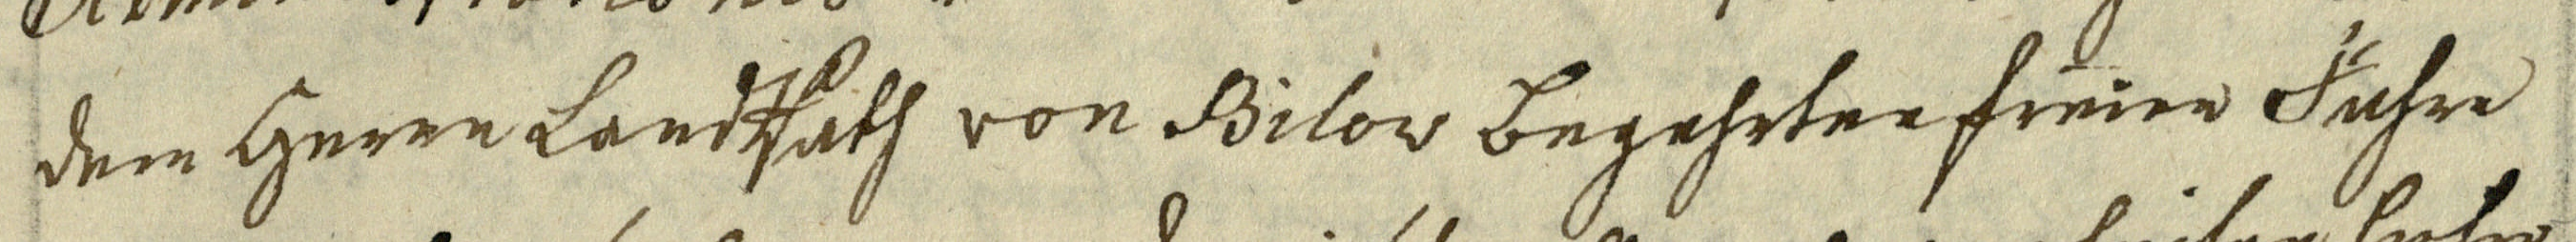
dem Herrn LandRath von Bilow begehrten freien Fuhre
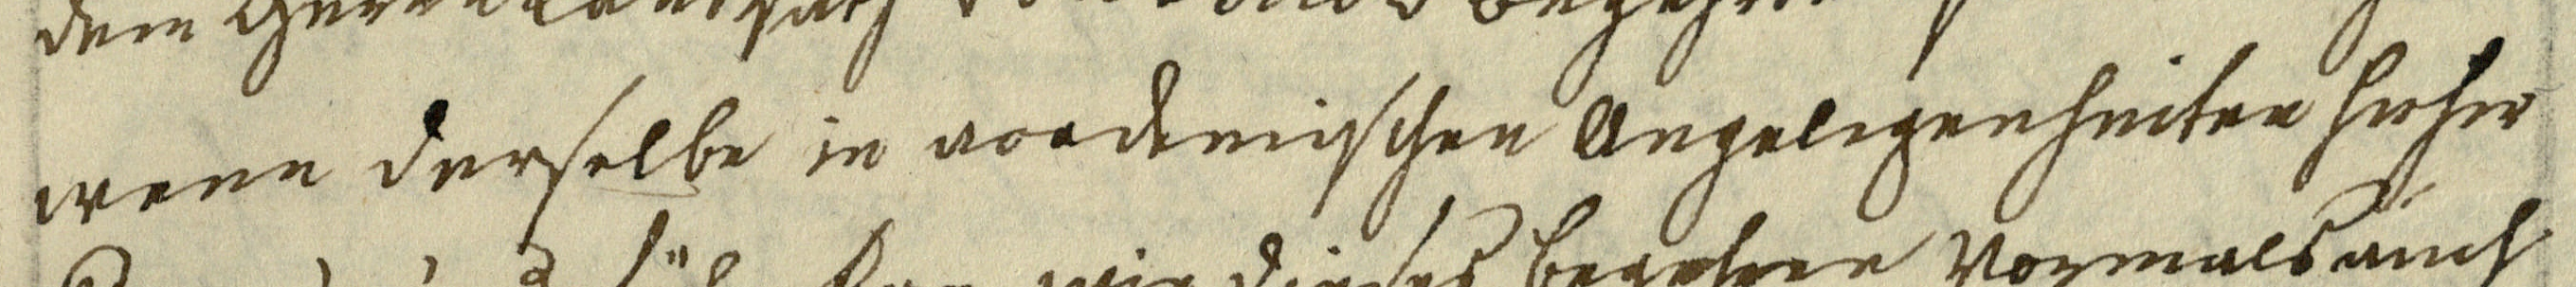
wenn derselbe in academischen Angelegenheiten hieher
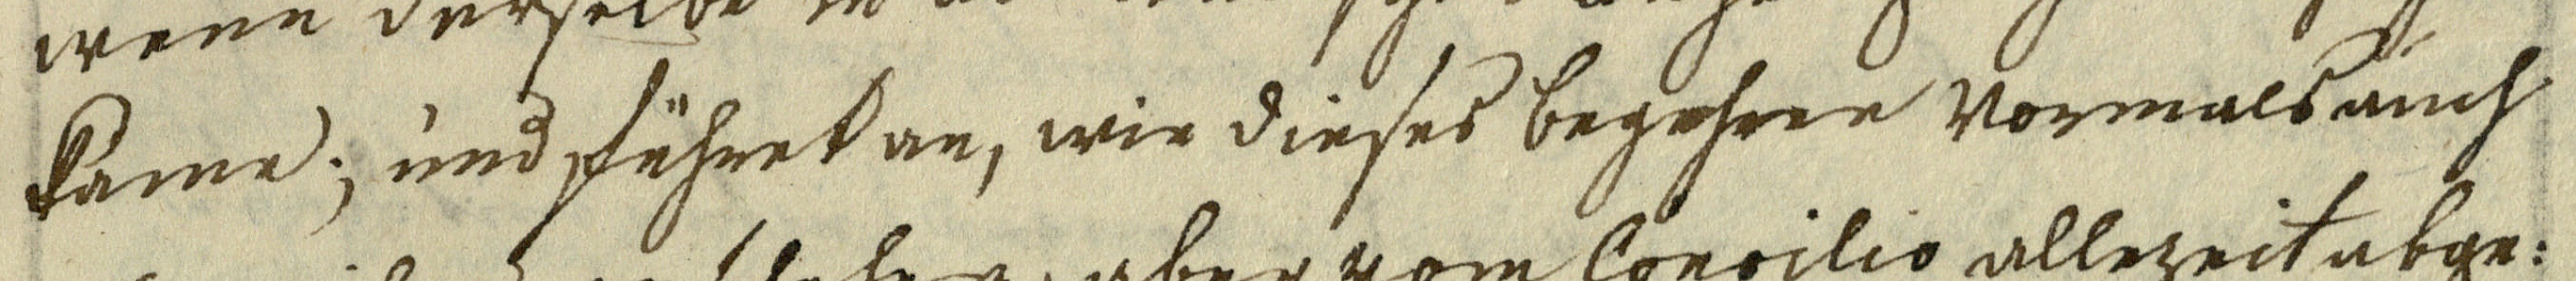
käme; und führet an, wie dieses Begehren vormals auch
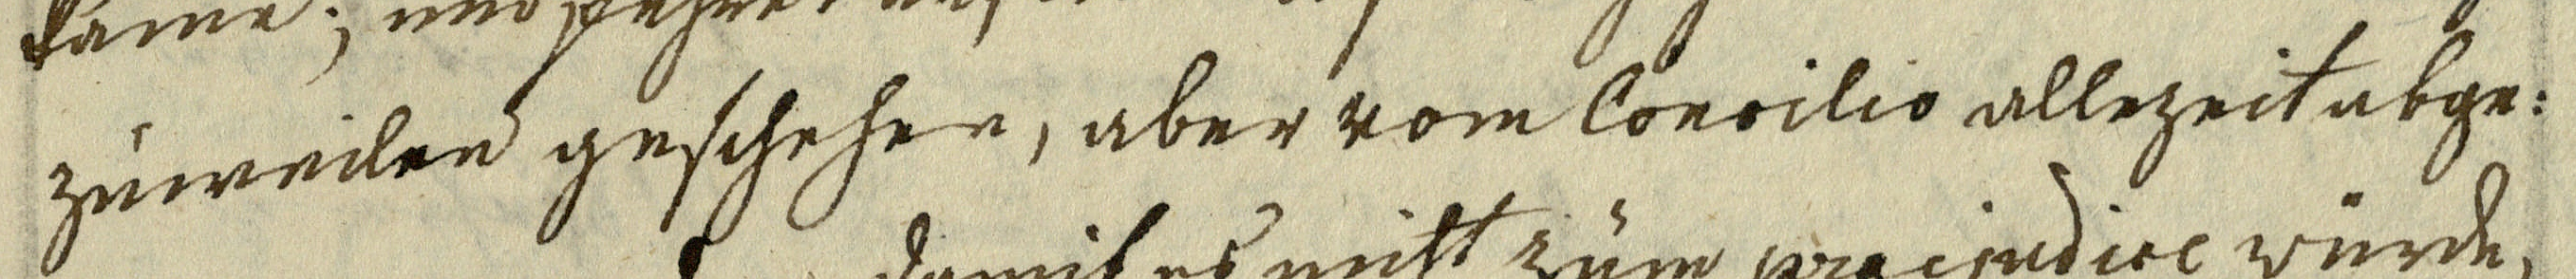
zuweilen geschehen, aber von Concilio allezeit abge¬
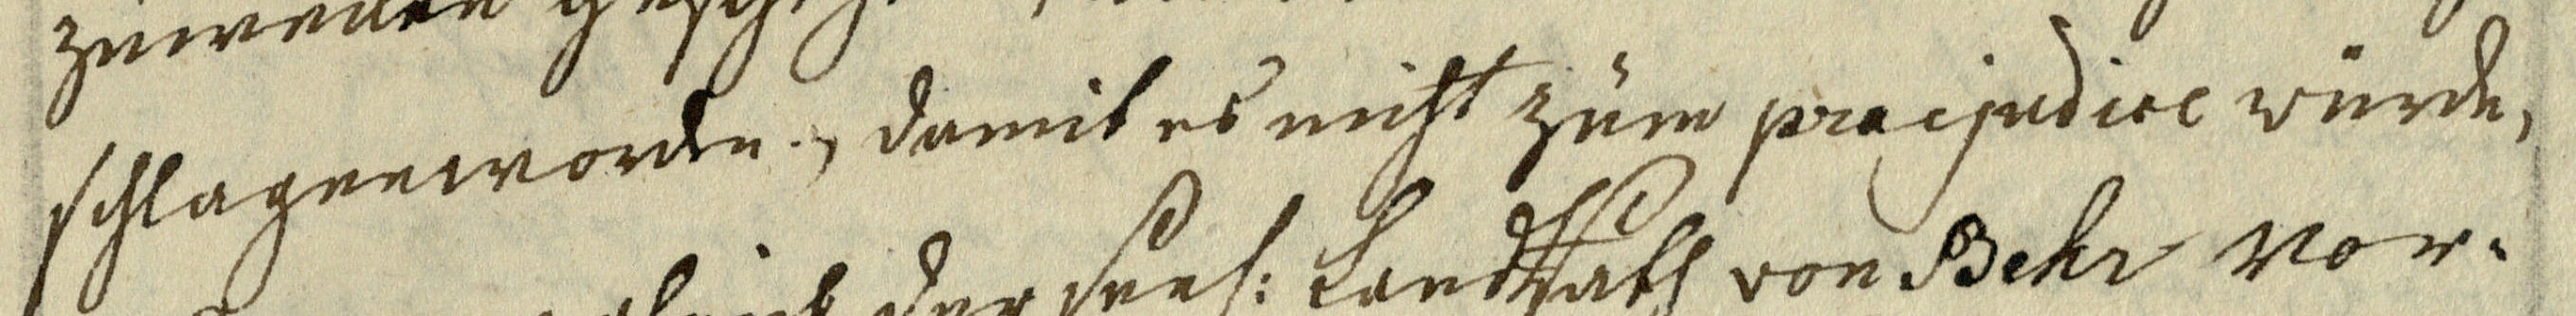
schlagen worden, damit es nicht zum praejudice würde,
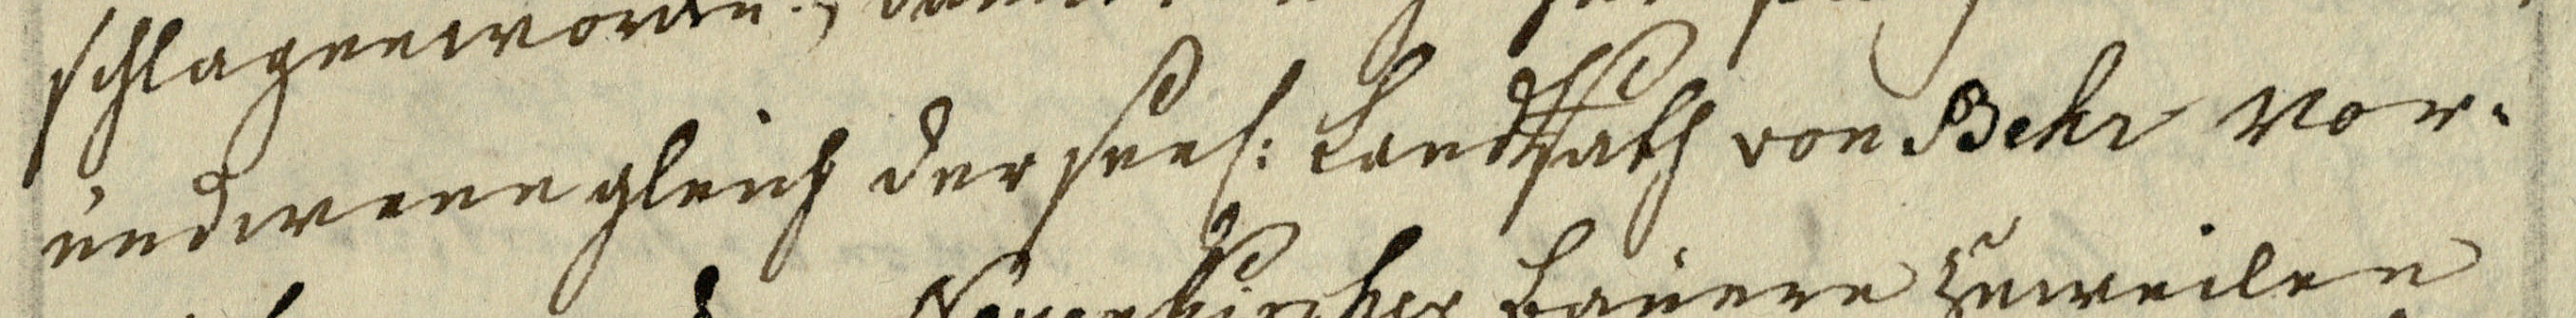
und wenn gleich der seel. LandRath von Behr vor¬
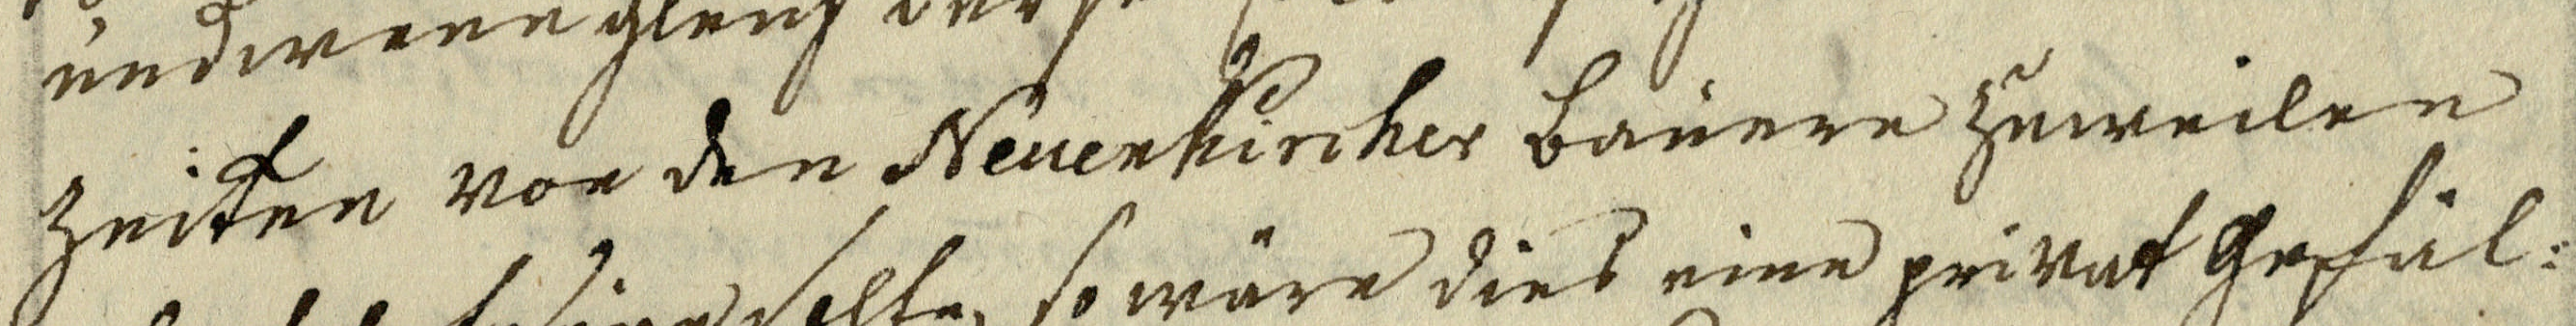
zeiten von den Neuenkircher Bauern zuweilen
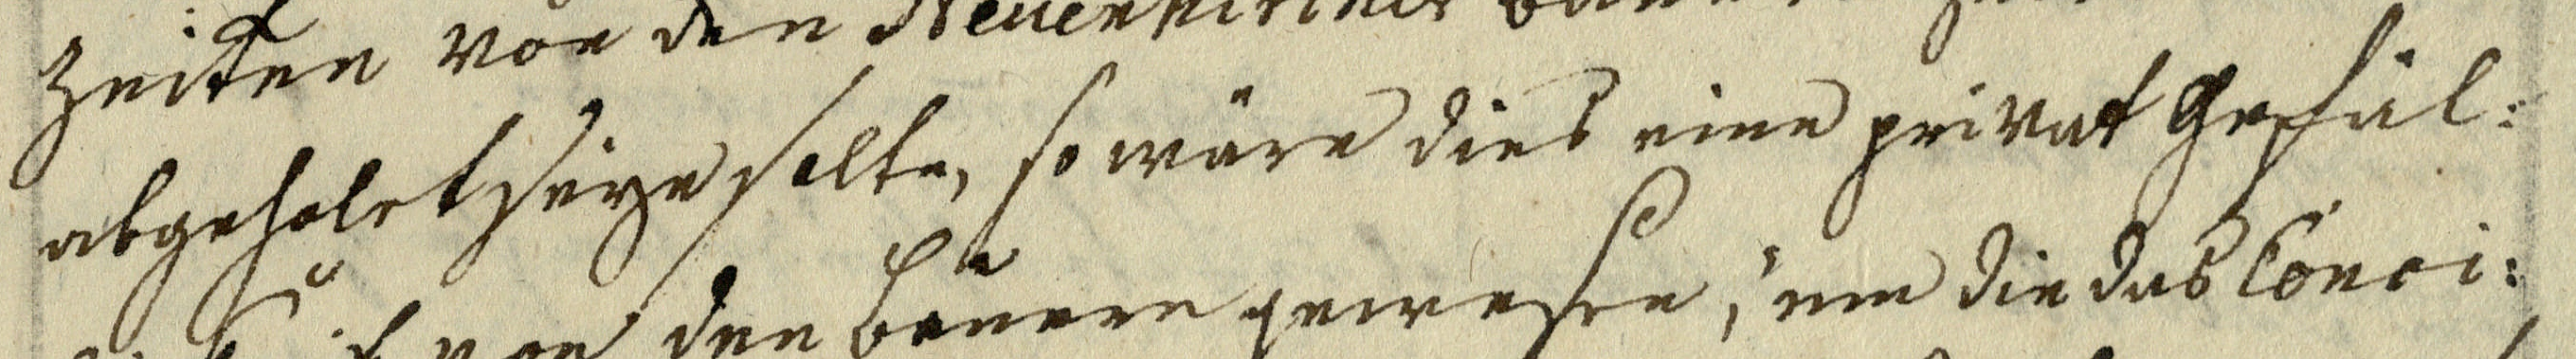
abgeholet seÿn solte, so wäre dies eine privat Gefäl¬
